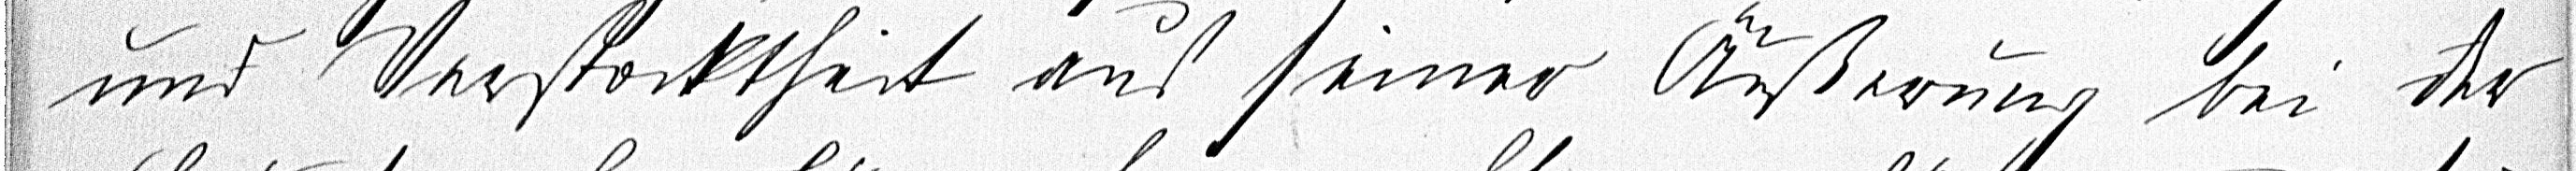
und Verstocktheit aus seiner Außerung bei der
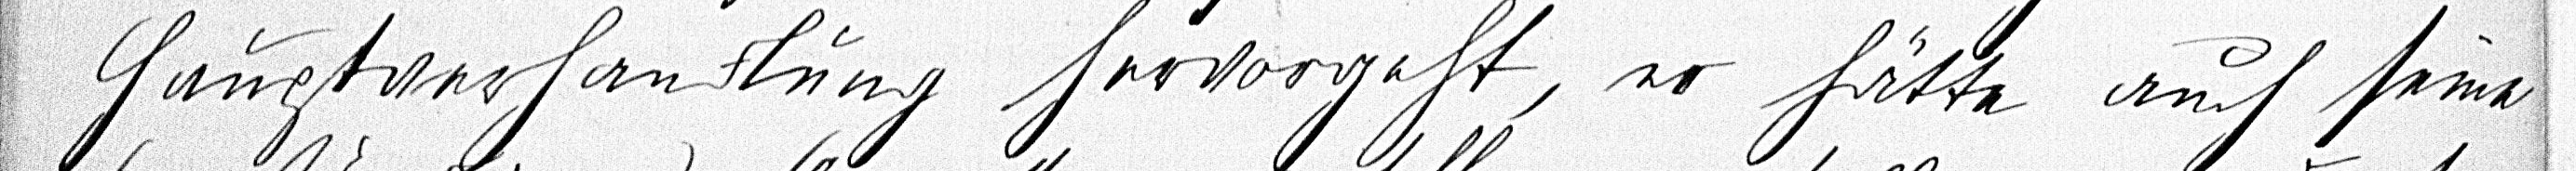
Hauptverhandlung hervorgeht, er hätte auch seine
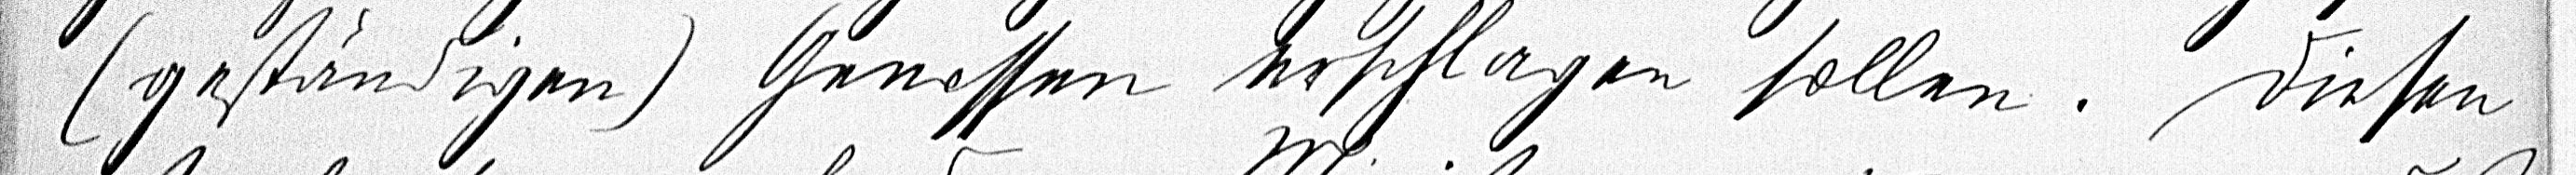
(geständigen) Genossen erschlagen sollen. Diesen
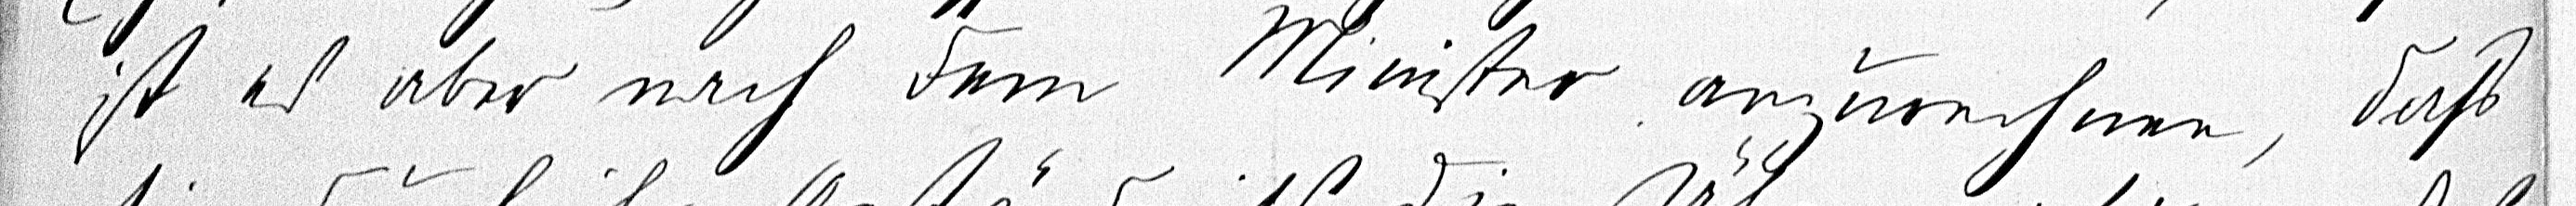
ist es aber nach dem Minister anzurechnen, daß
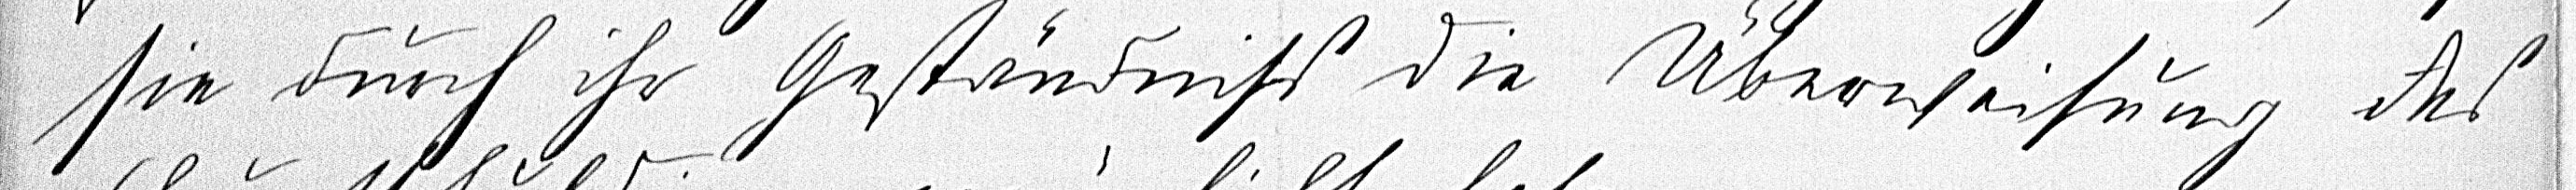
sie durch ihr Geständniss die Überweisung des
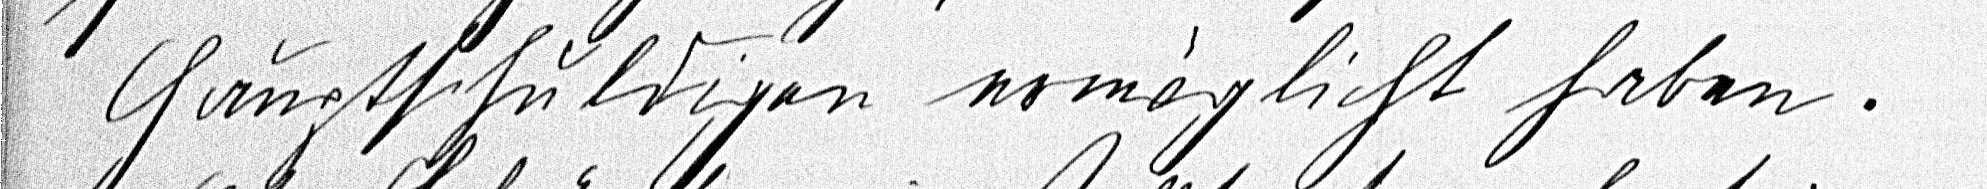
Hauptschuldigen ermöglicht haben.
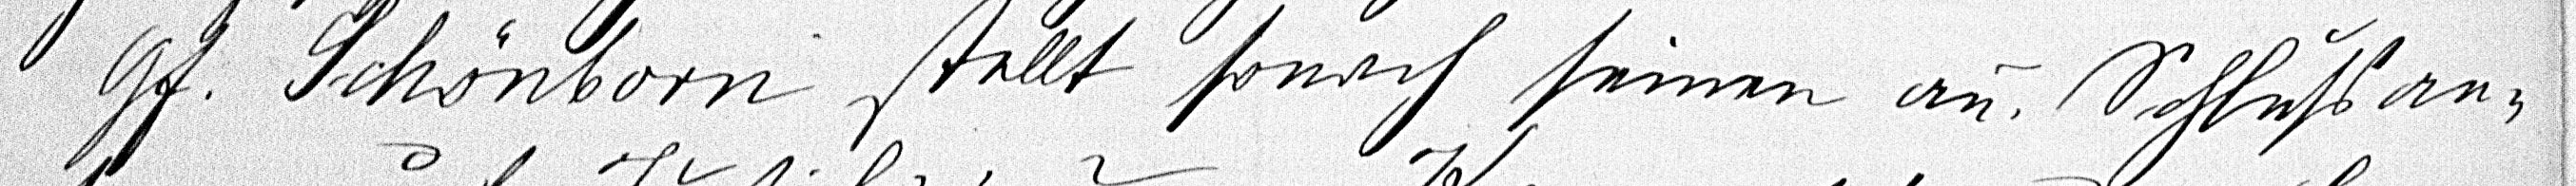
Gf. Schöborn stellt sonach seinen axx Schlussan¬
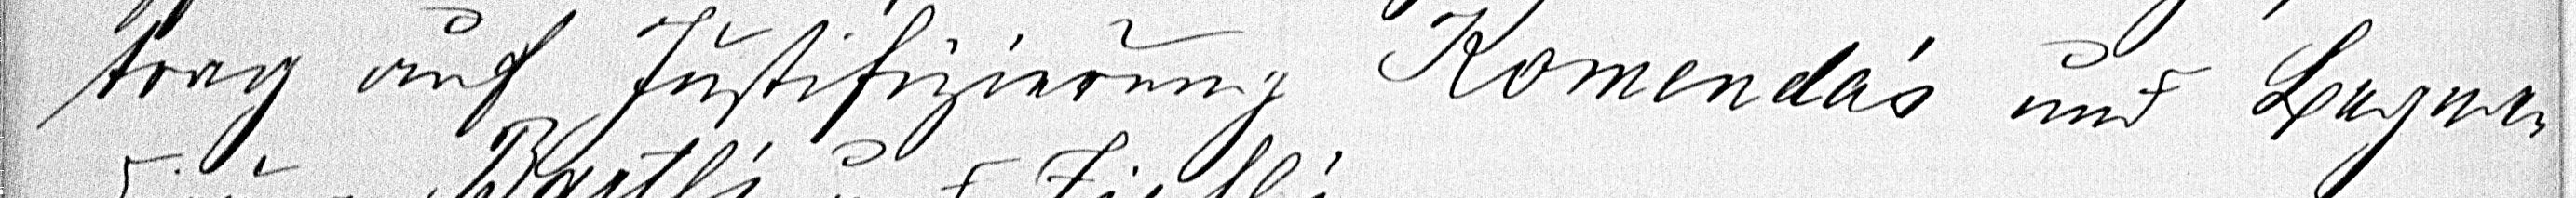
trag auf Justifizierung Komendás und Begne¬
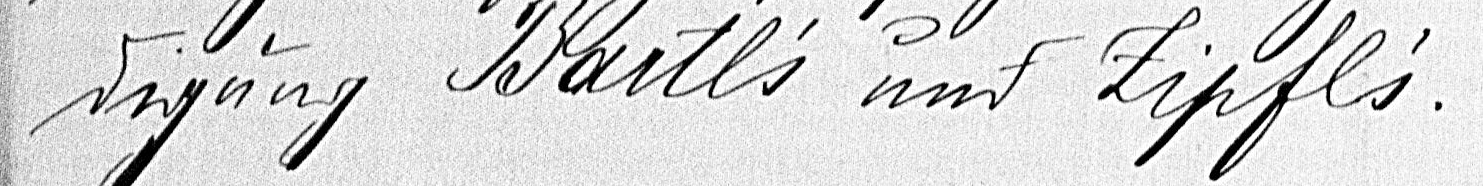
digung Bartl's und Zipfl's.
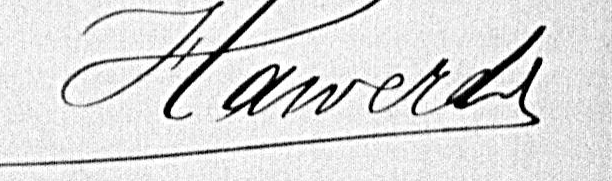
Hawerdxx
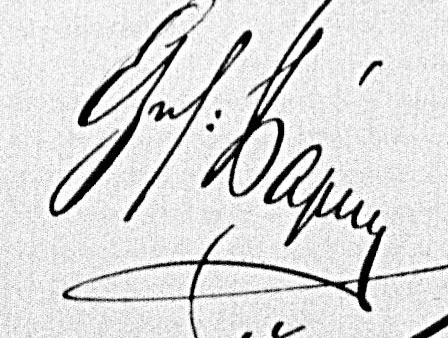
Ges: xx
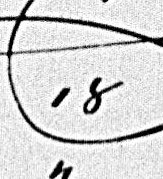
18
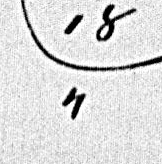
xx
